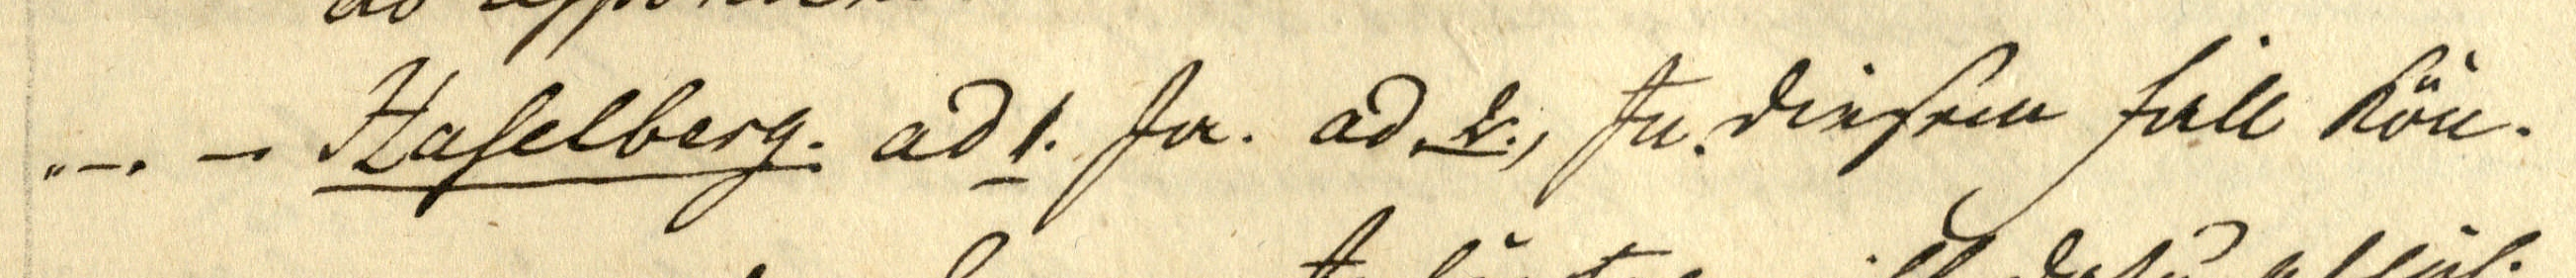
" - " - " Haselberg. ad 1. Ja. ad 2., In diesem Fall kön-
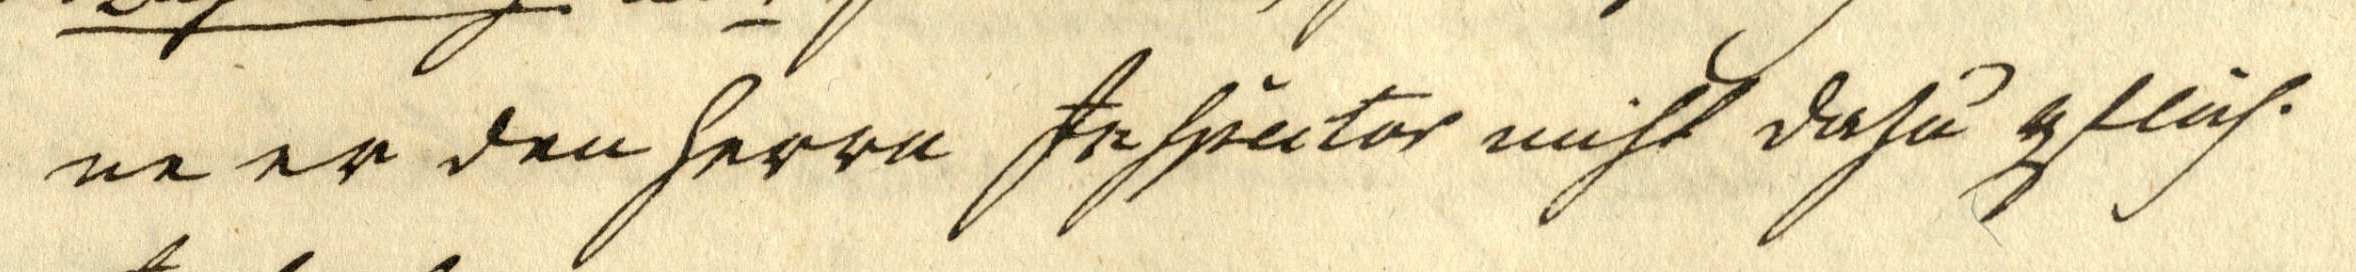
ne er den Herrn Inspector nicht dazu pflich-
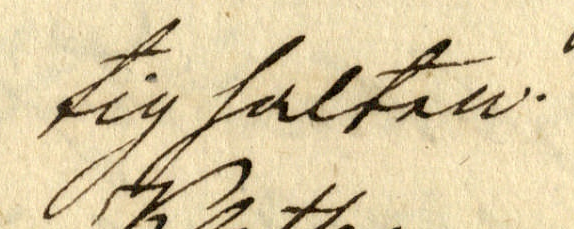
tig halten.
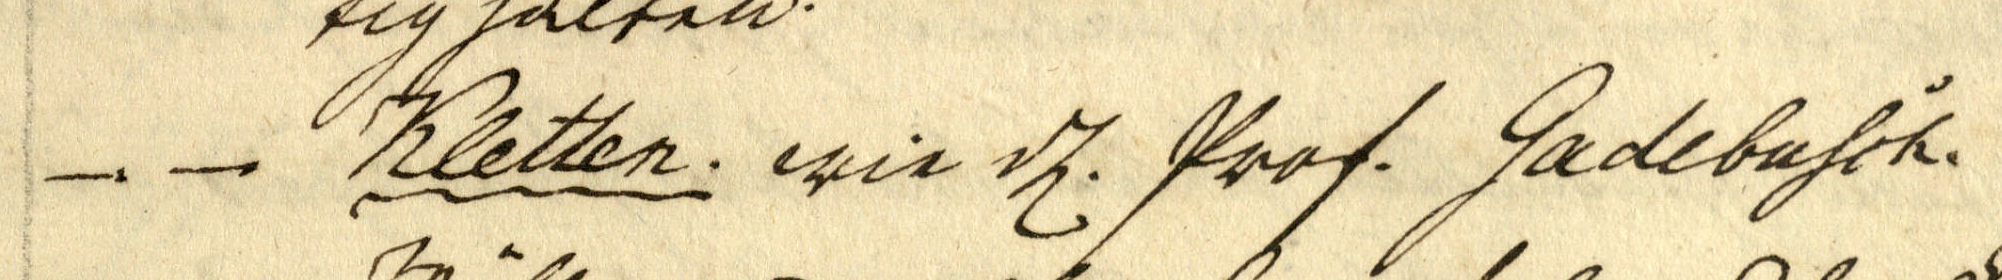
- " - Kletten. wie dh. Prof. Gadebusch.
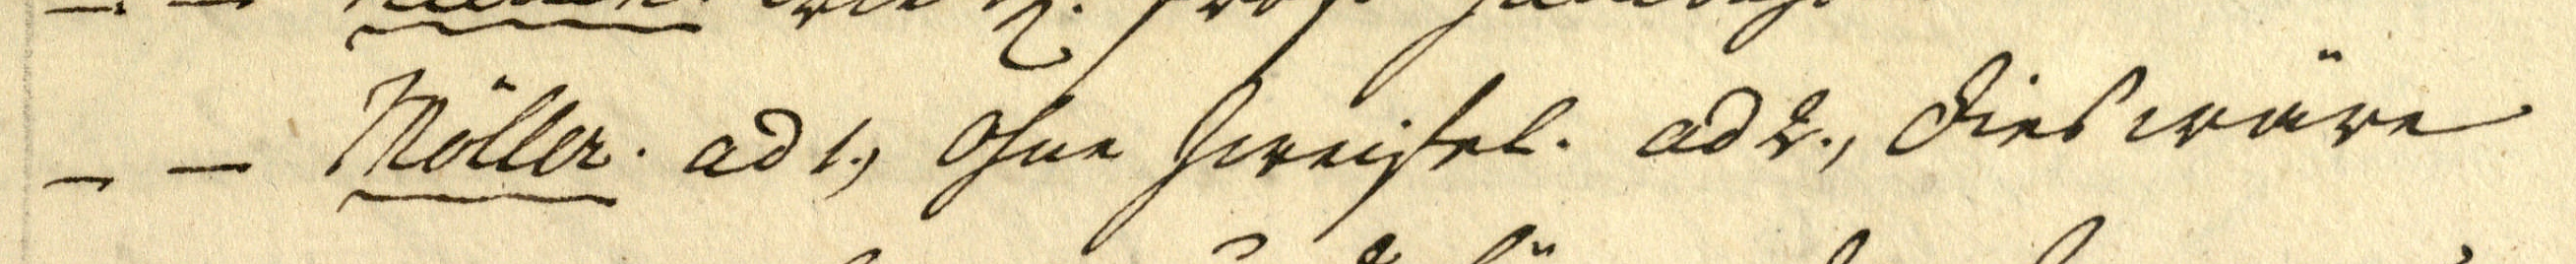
- " - Möller. ad 1., Ohne Zweifel. ad 2., Dies wäre
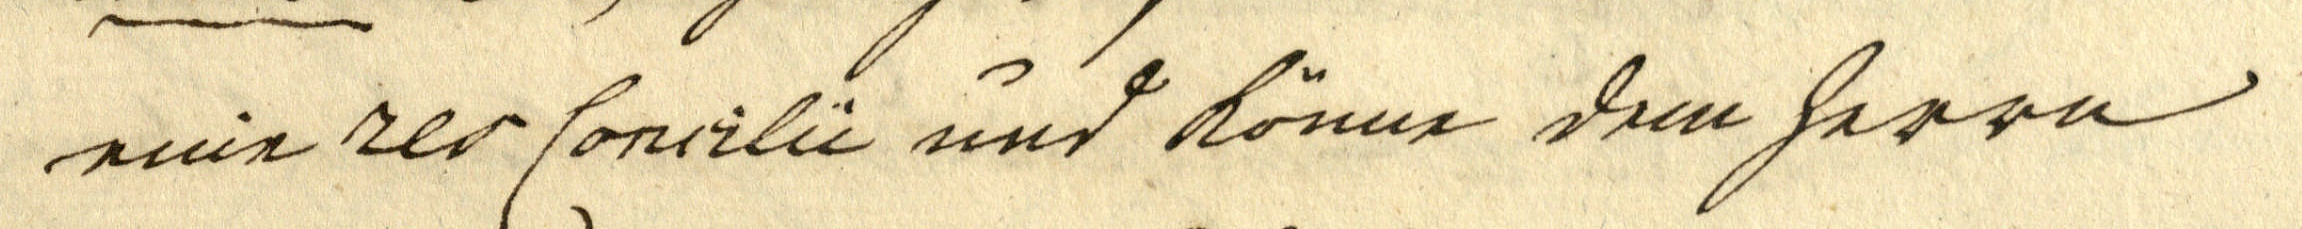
eine res Concilii und könne dem herrn
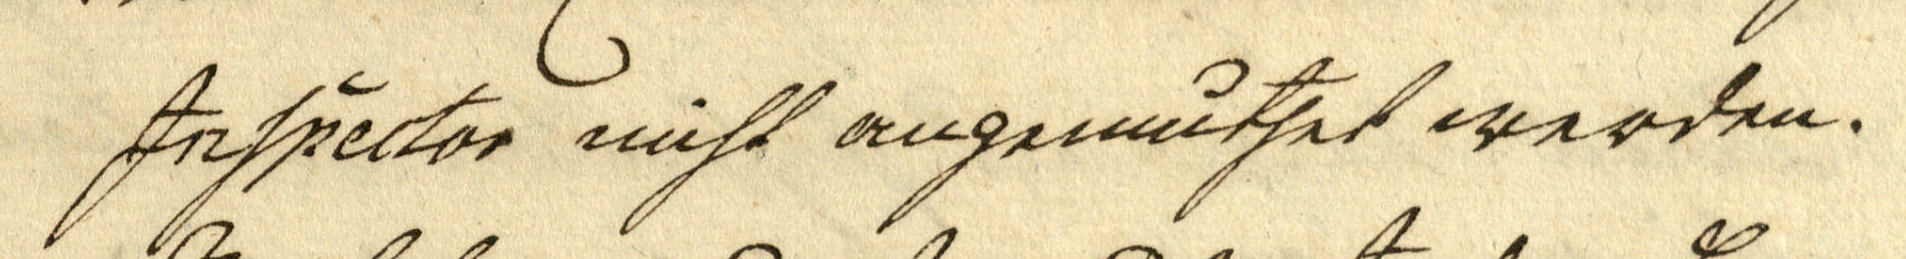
Inspector nicht angemuthet werden.
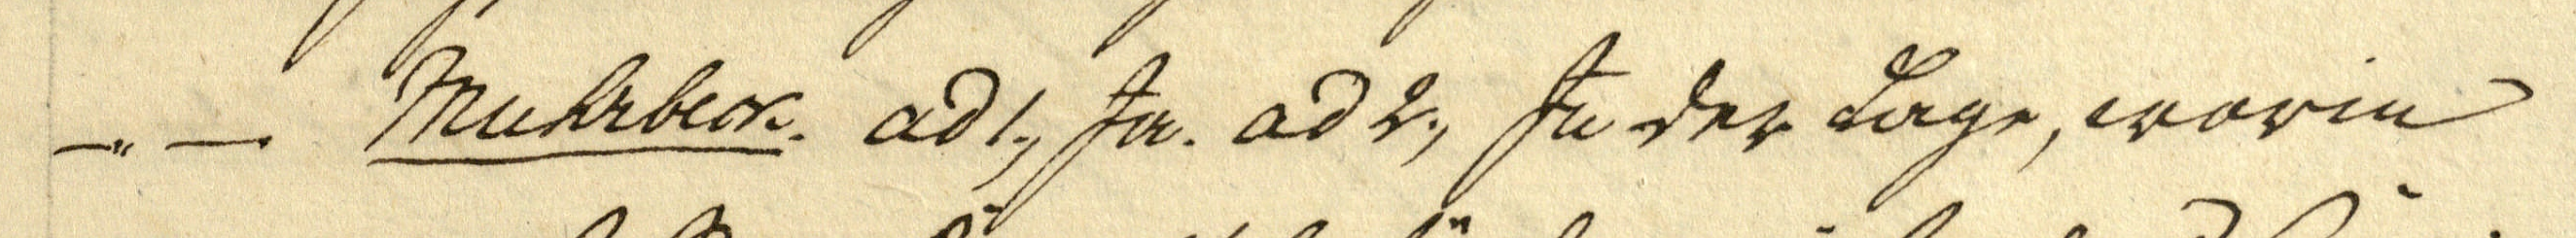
- " - " Muhrbeck. ad 1., Ja. ad 2., In der Lage, worin
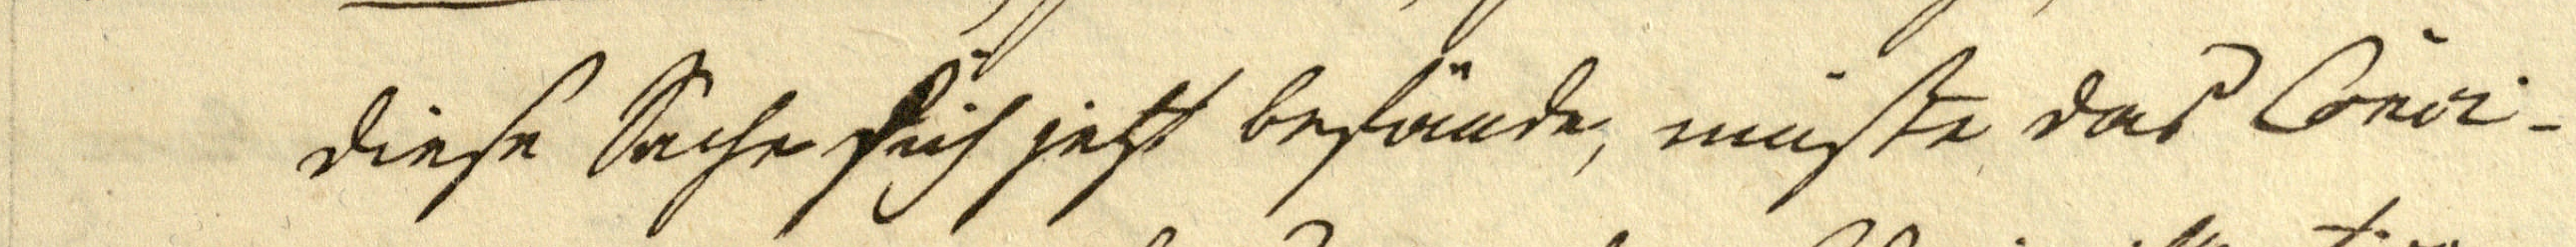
diese Sache sich jetzt befände, müßte das Conci-
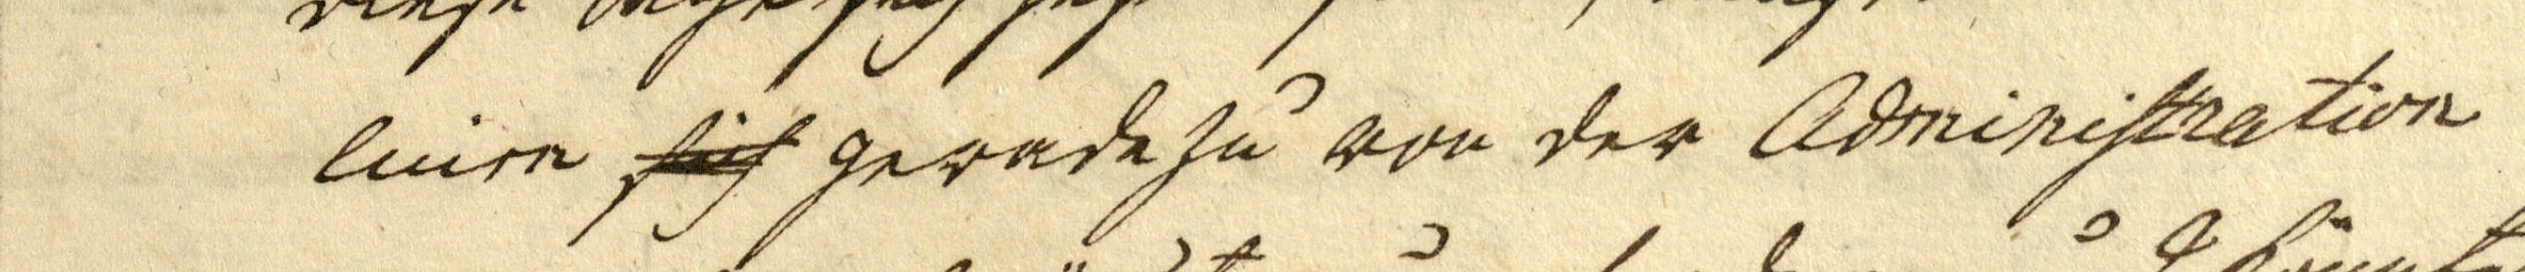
lium gerade zu von der Administration
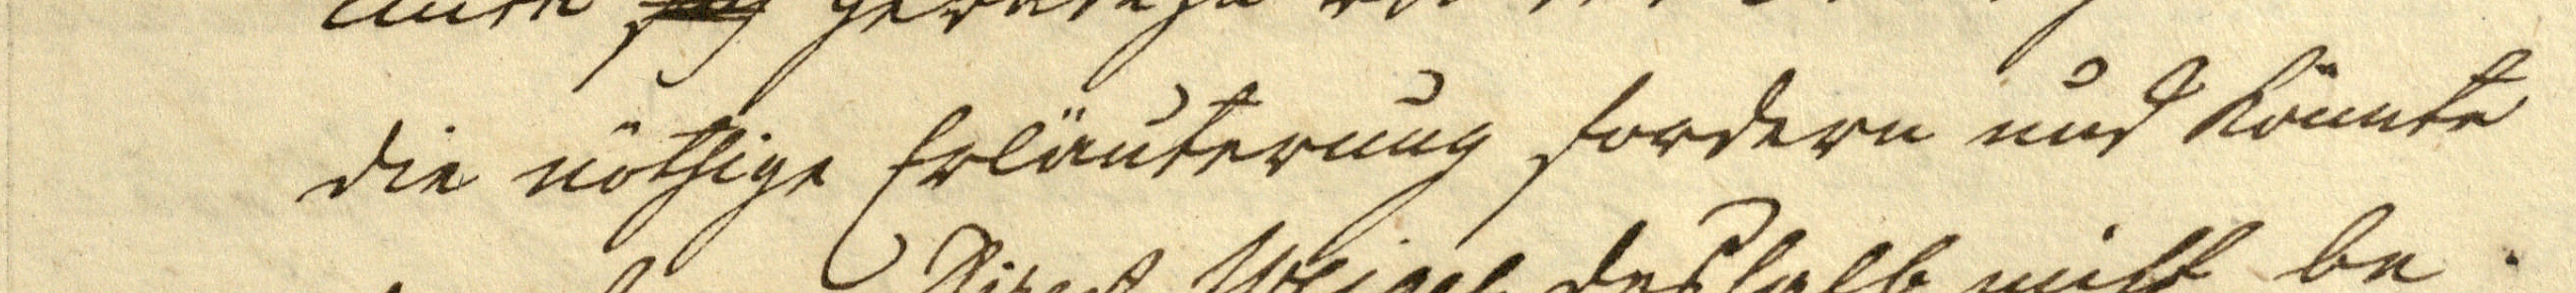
die nöthige Erläuterung fordern und könnte
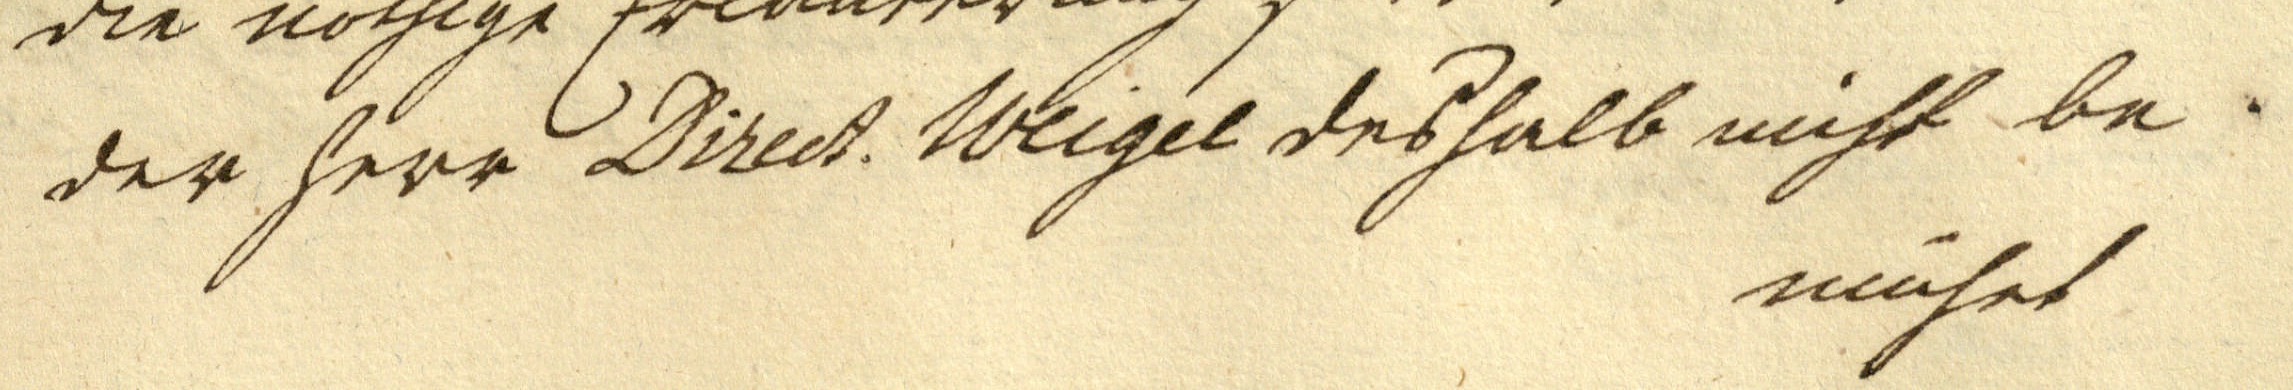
der Herr Direct. Weigel deshalb nicht be-
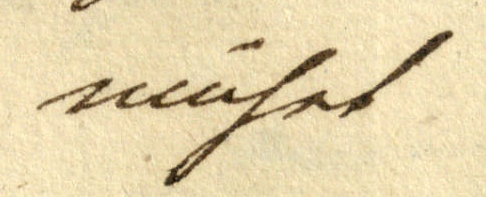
mühet
